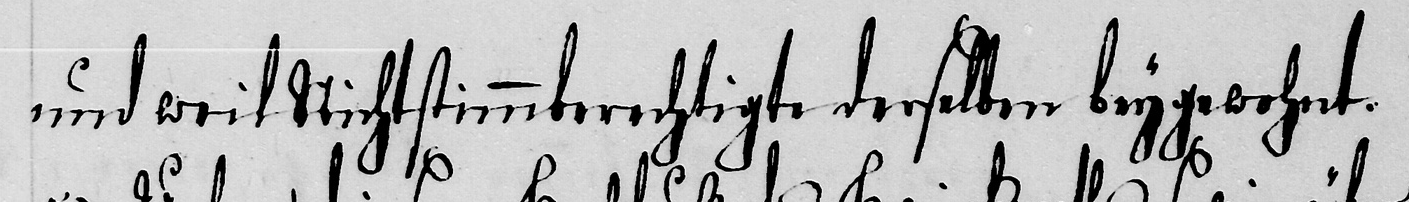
und weil Nichtstimmberechtigte derselben beygewohnt.
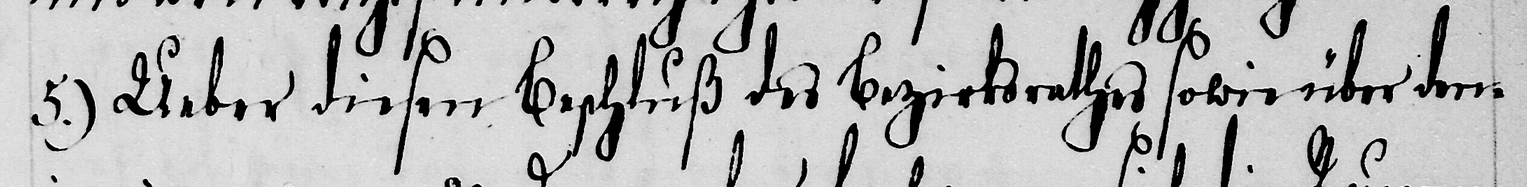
5.) Ueber diesen Beschluß des Bezirksrathes sowie über den¬
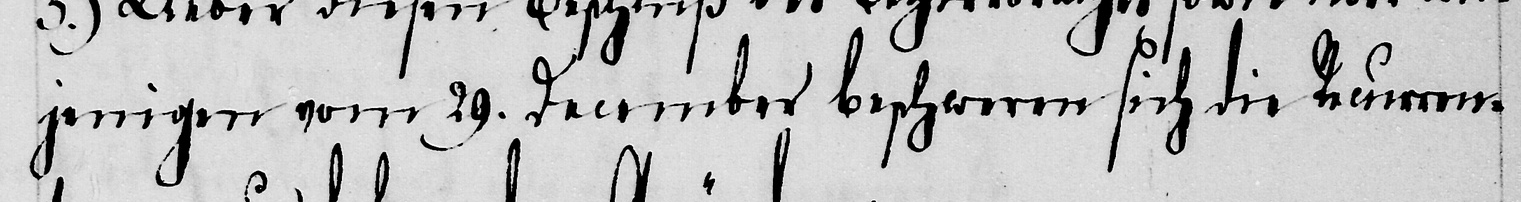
jenige vom 29. December beschweren sich die Recurren¬
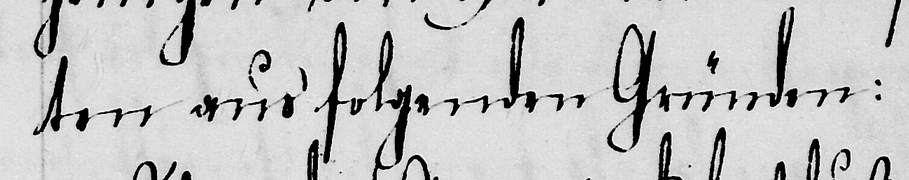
ten aus folgenden Gründen:
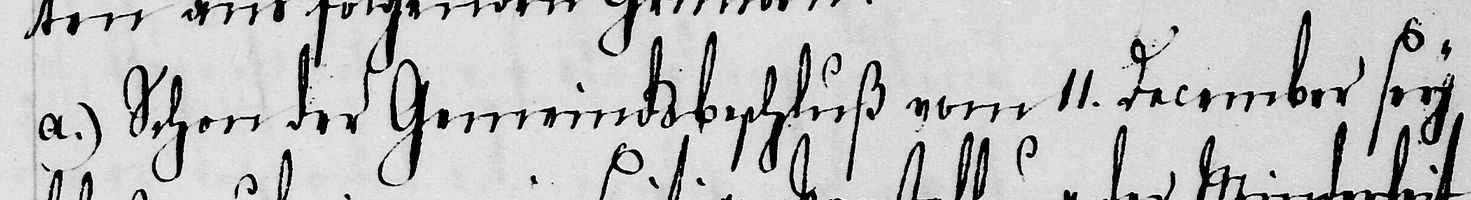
a.) Schon der Gemeindsbeschluß vom 11. December sey
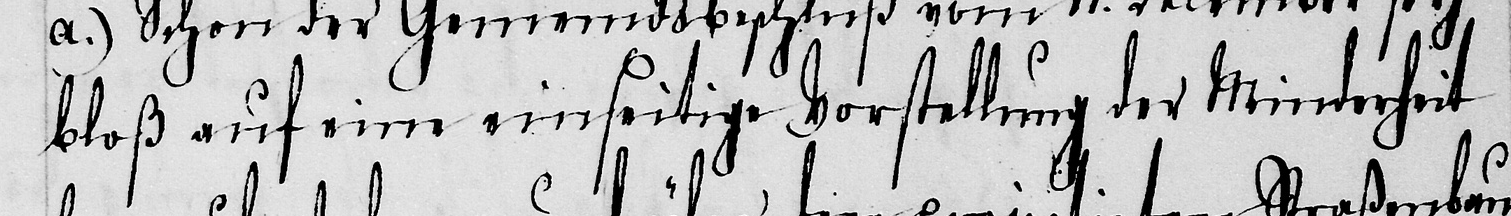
bloß auf eine einseitige Vorstellung der Minderheit
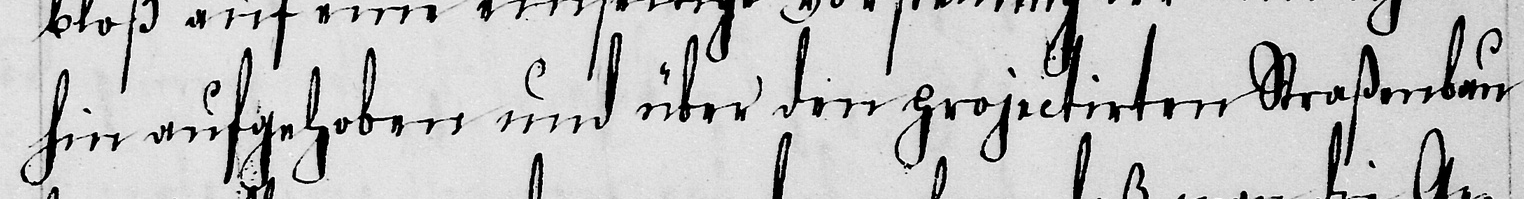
hin aufgehoben und über den projectirten Straßenbau
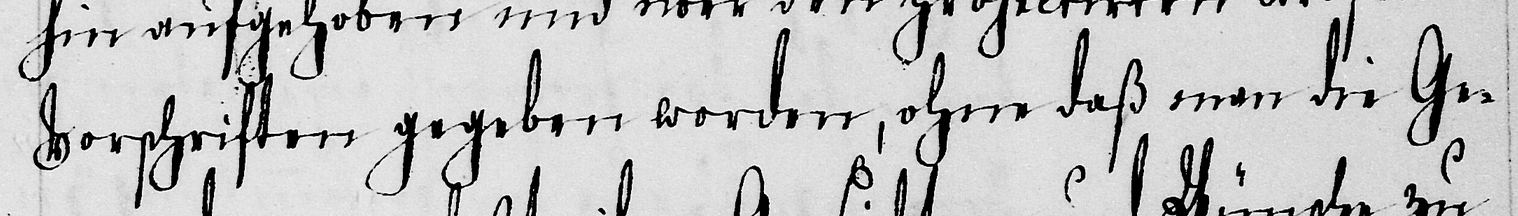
Vorschriften gegeben worden, ohne daß man die Ge¬
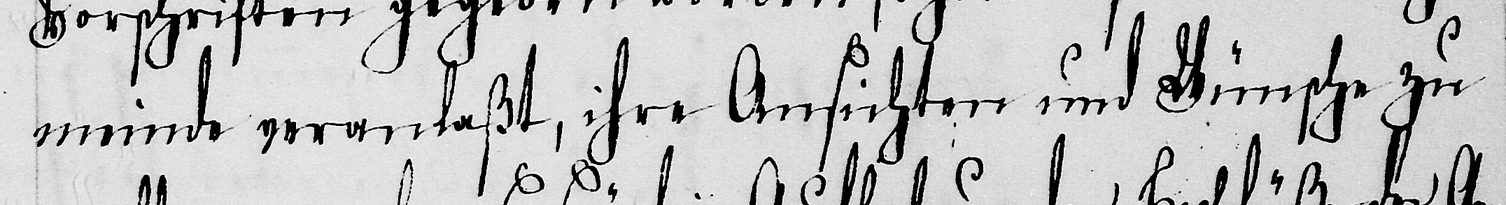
meinde veranlaßt, ihre Ansichten und Wünsche zu
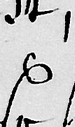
b.)
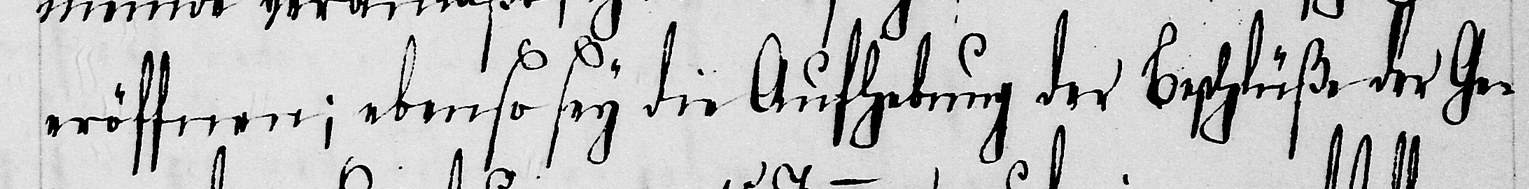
eröffnen; ebenso sey die Aufhebung der Beschlüße der Ge¬
